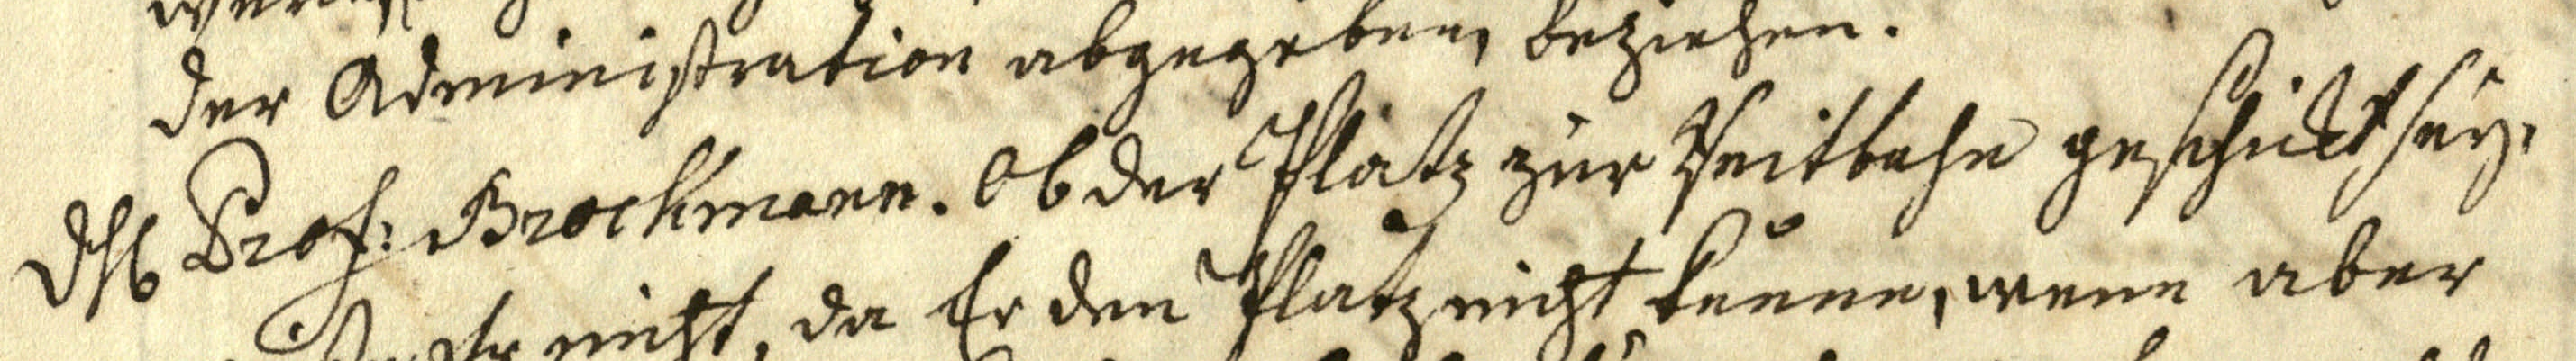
dh. Prof. Brockmann. ob der Platz zur Reitbahn geschickt seÿ,
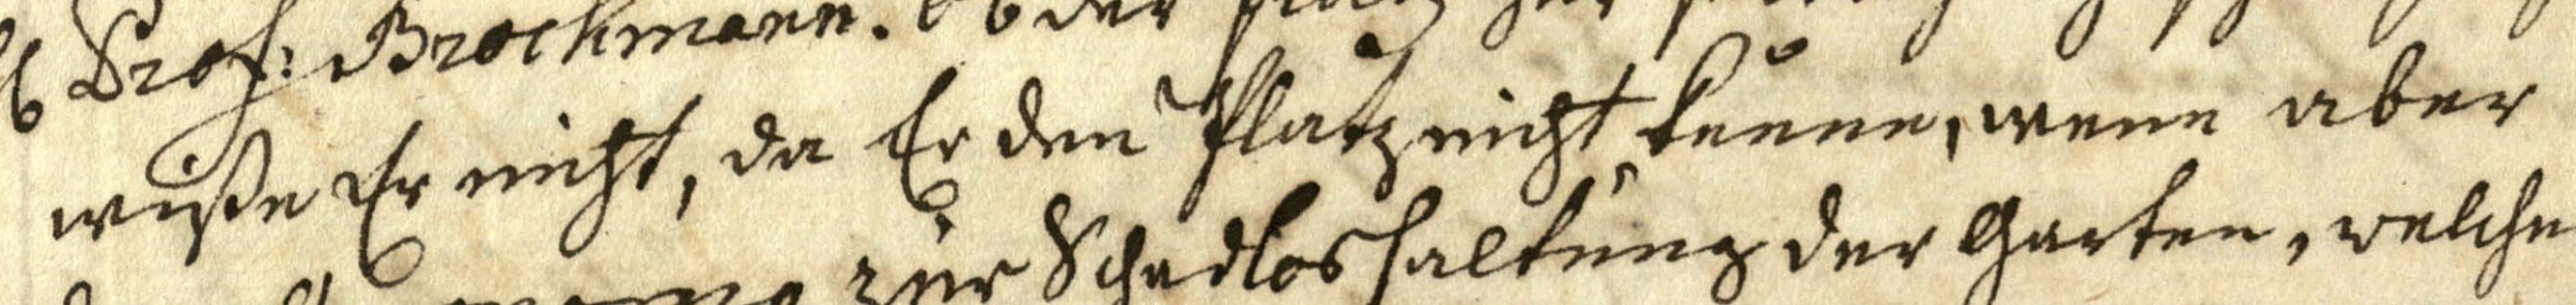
wüßte Er nicht, da Er den Platz nicht kenne, wenn aber
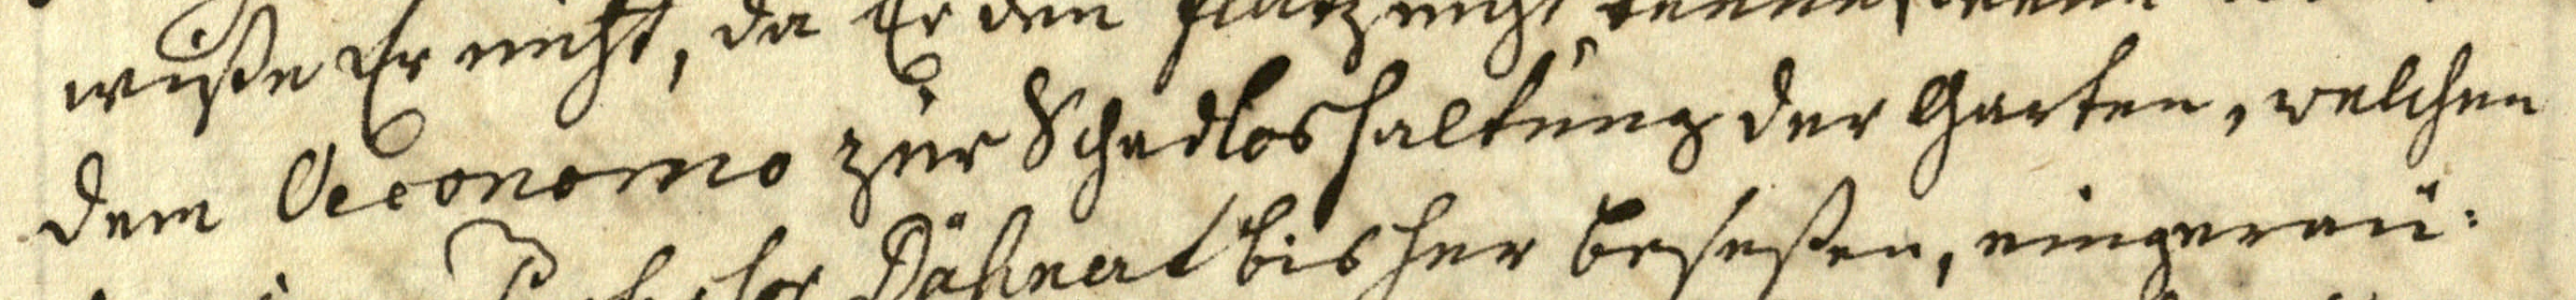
dem Oeconomo zur Schadloshaltung der Garten, welchen
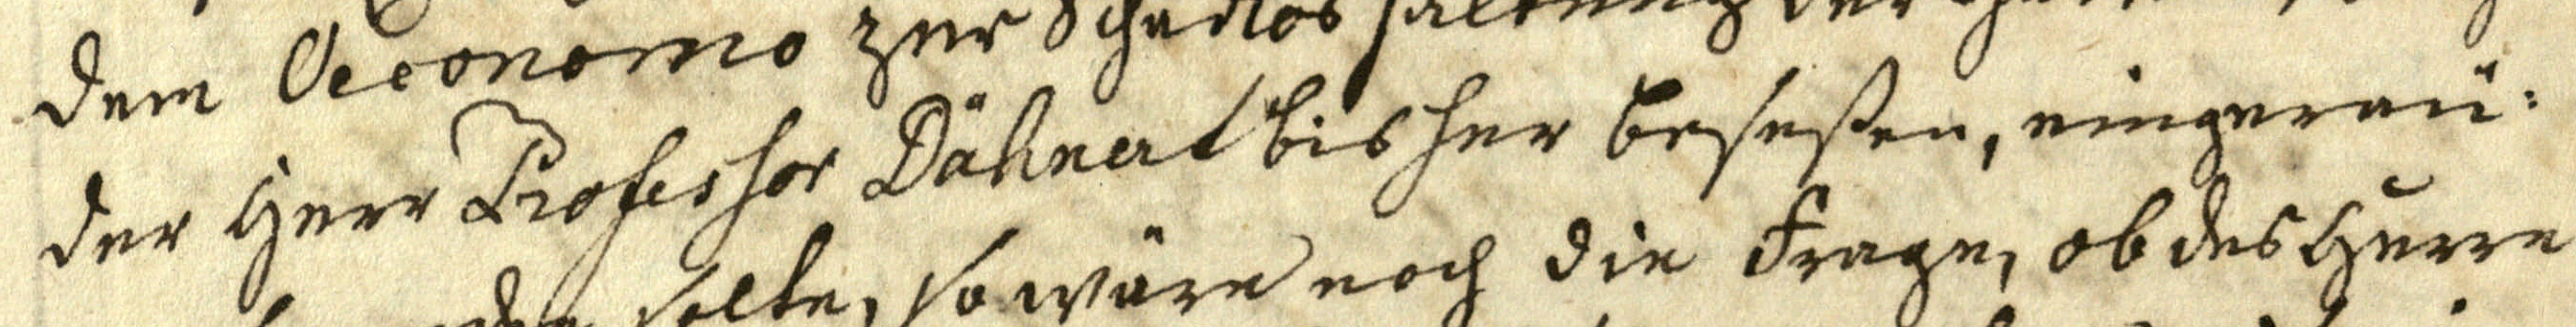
der Herr Professor Dähnert bisher beseßen, eingeräu¬
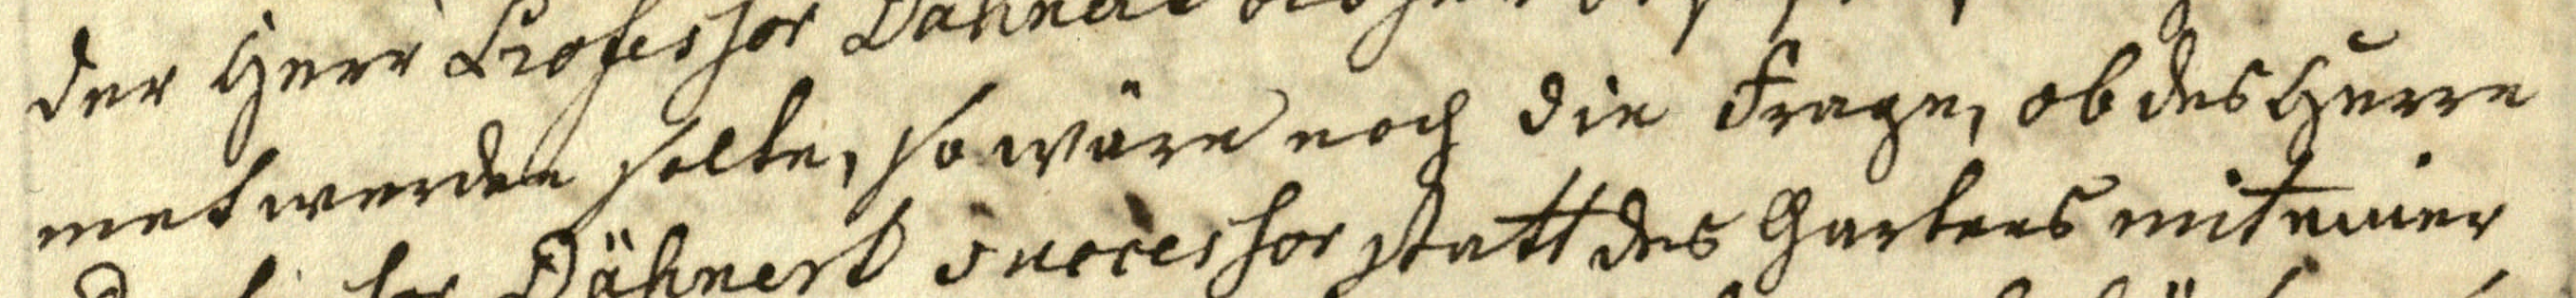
met werden solte, so wäre noch die Frage, ob des Herrn
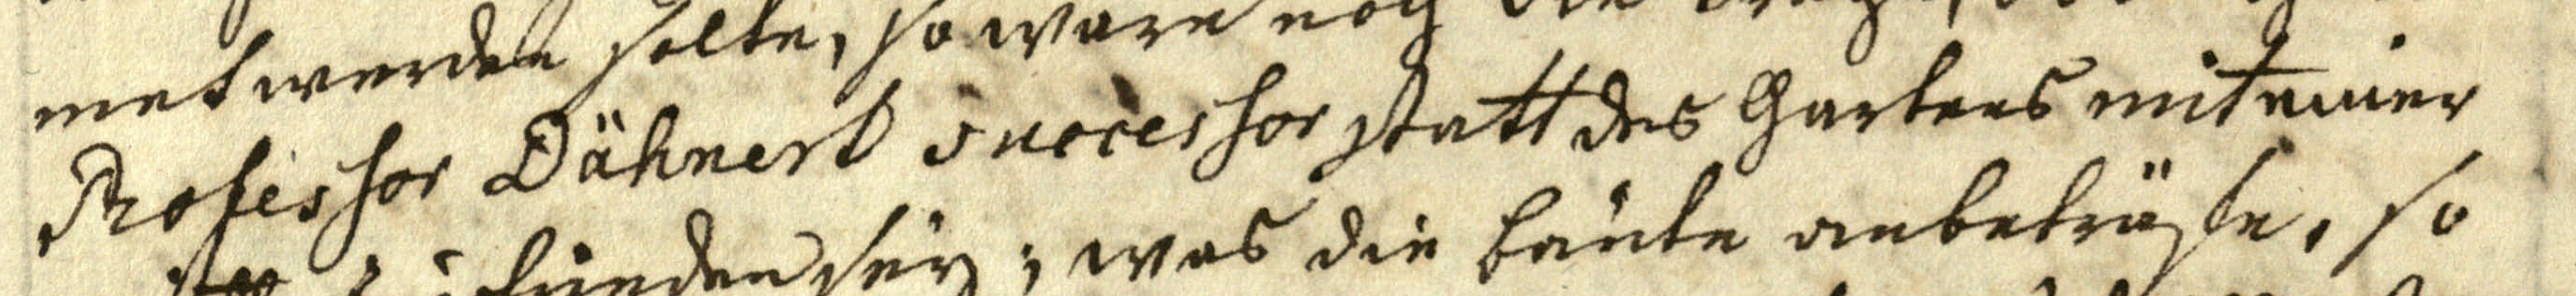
Professor Dähnert successor statt des Gartens mit einer
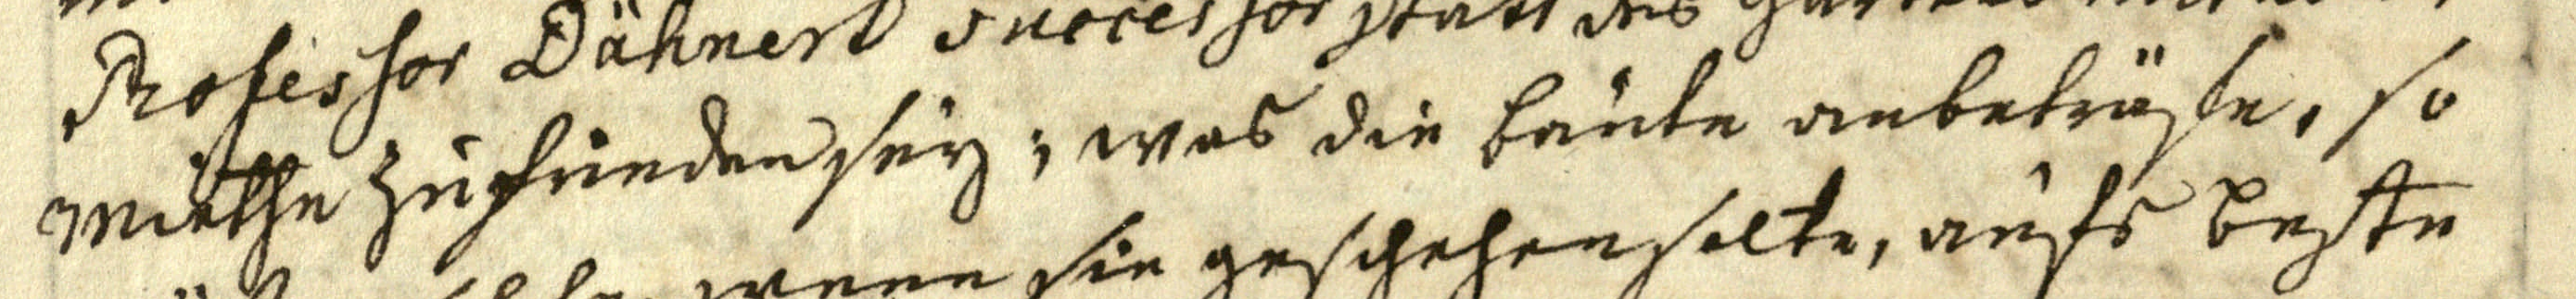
Miethe zufrieden seÿ, was die Baute anbeträfe, so
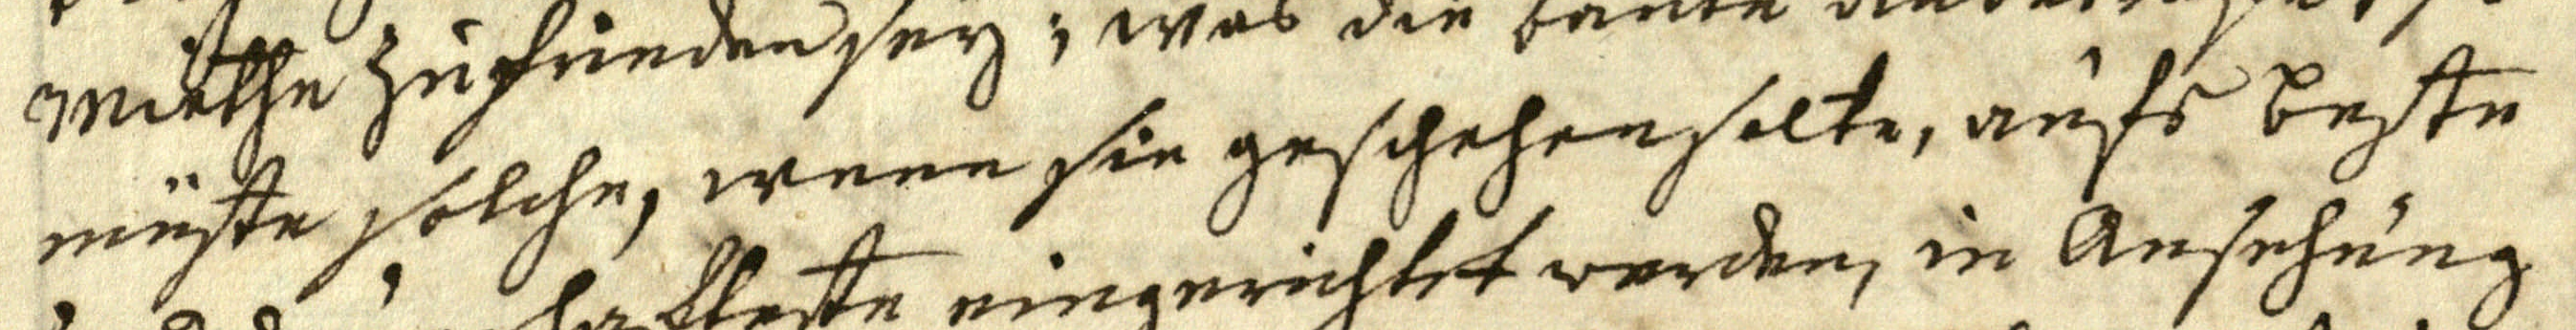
müste solche, wenn sie geschehen solte, aufs beste
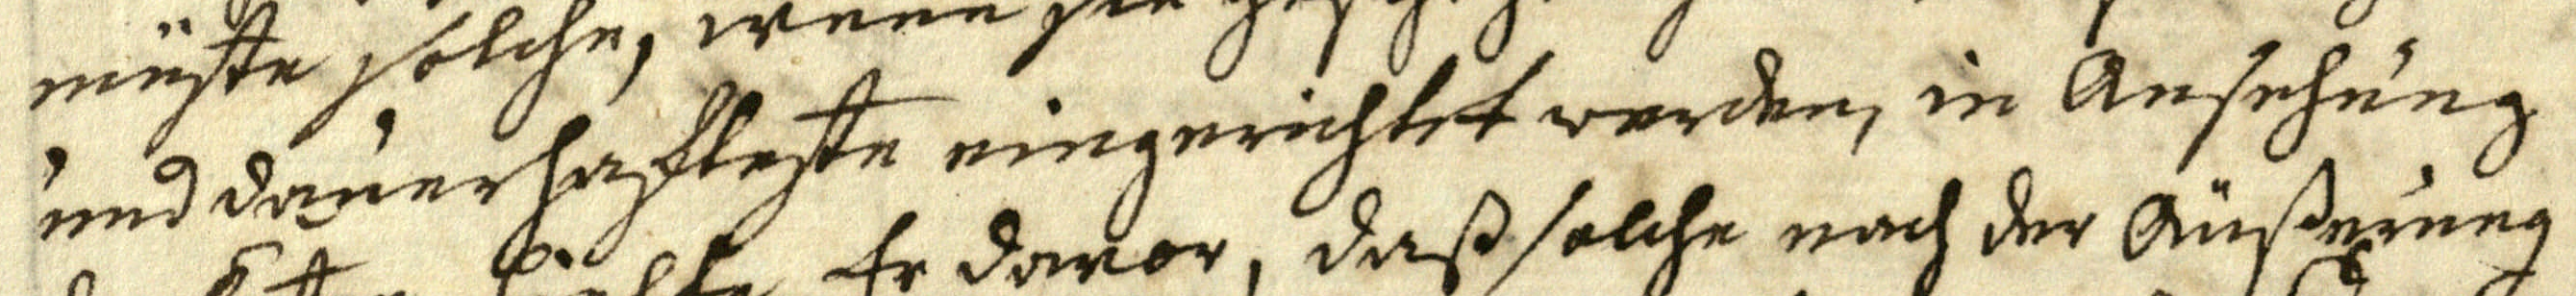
und dauerhafteste eingerichtet werden, in Ansehung
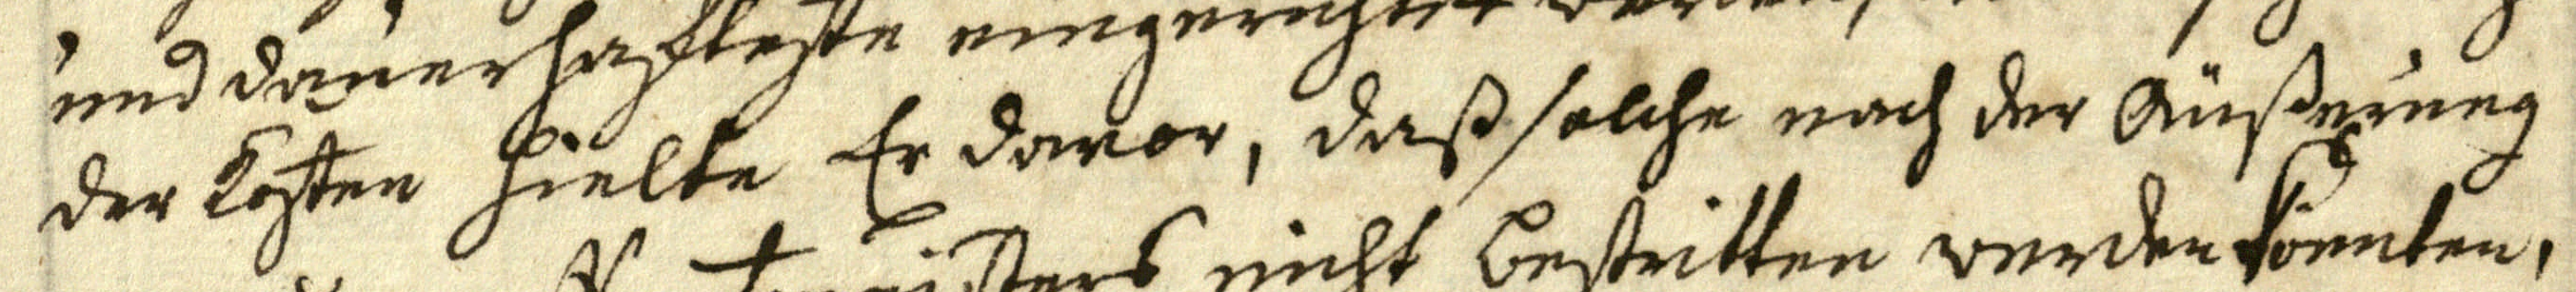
der Kosten hielte Er davor, daß solche nach der Äußerung
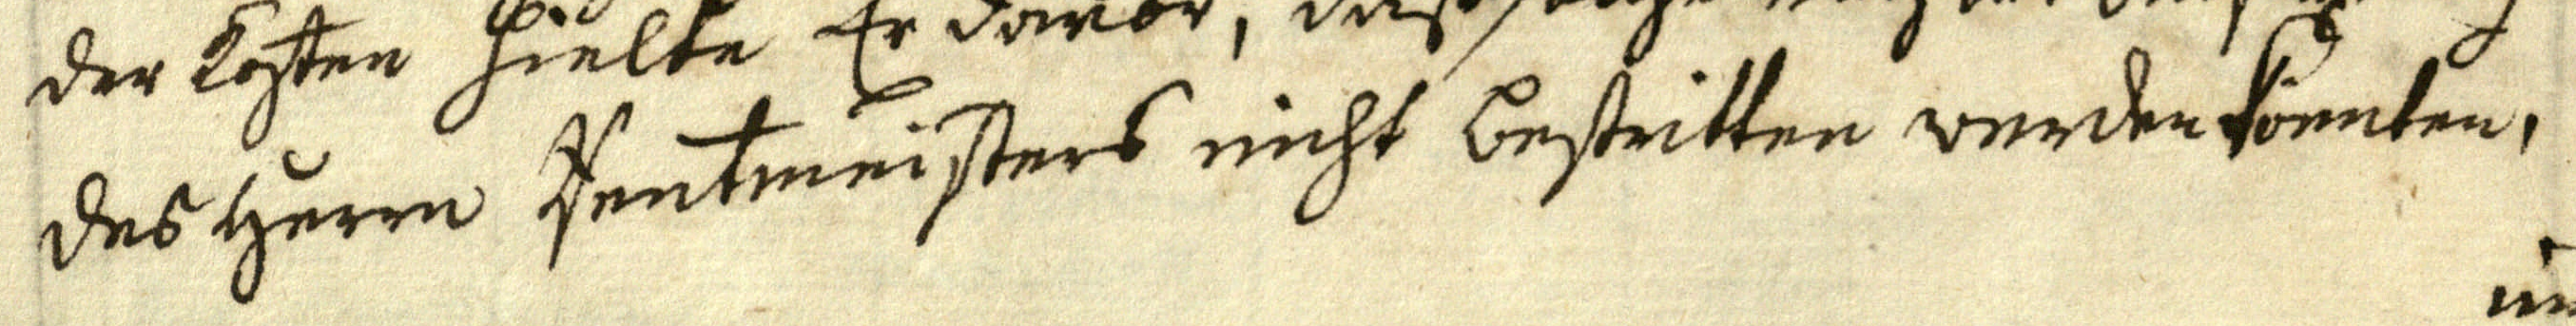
des Herrn Rentmeisters nicht bestritten werden könnten,
